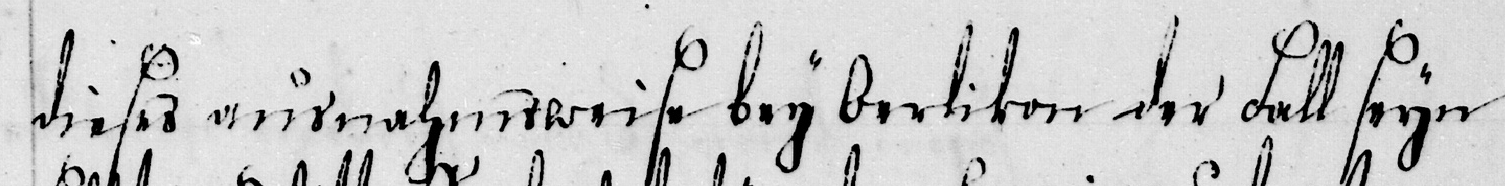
dieses ausnahmsweise bey Oerlikon der Fall seyn
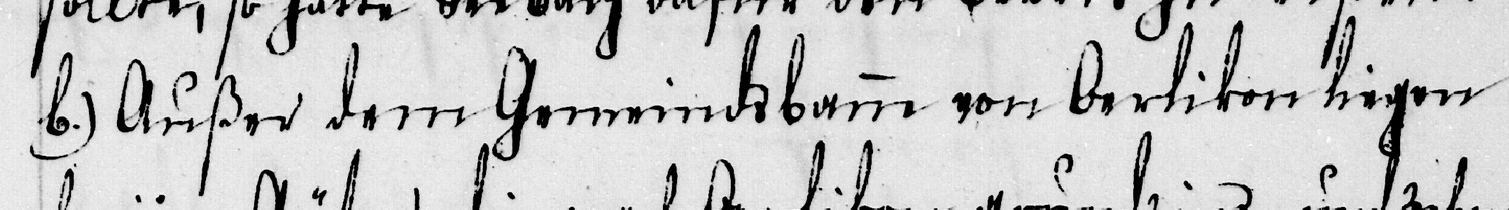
b.) Außer dem Gemeindsbanne von Oerlikon liegen
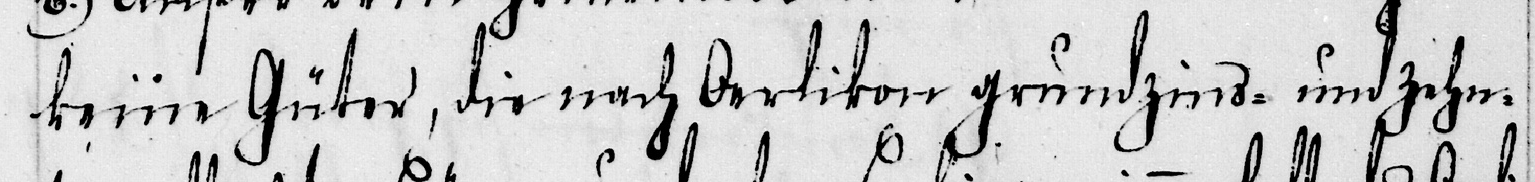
keine Güter, die nach Oerlikon grundzins- und zehn¬
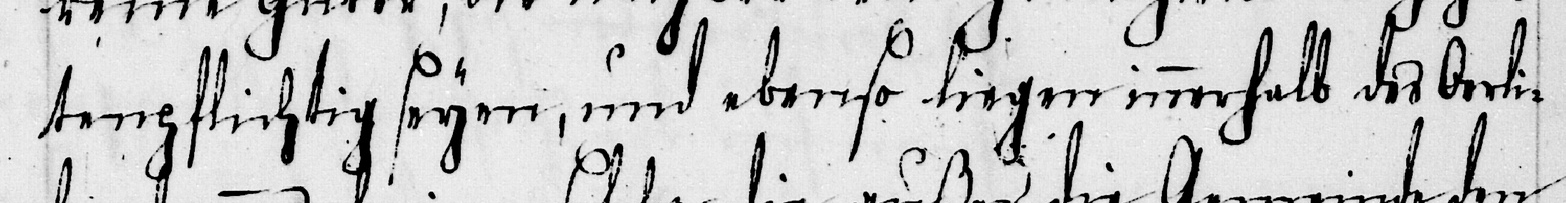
tenpflichtig seyen, und ebenso liegen innerhalb des Oerli¬
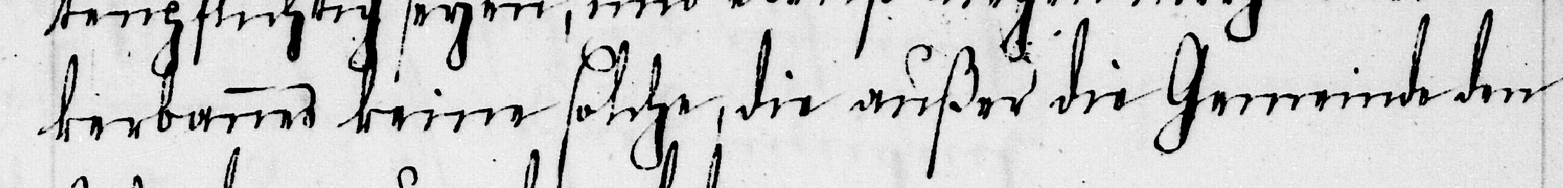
kerbannes keine solche, die außer die Gemeinde den
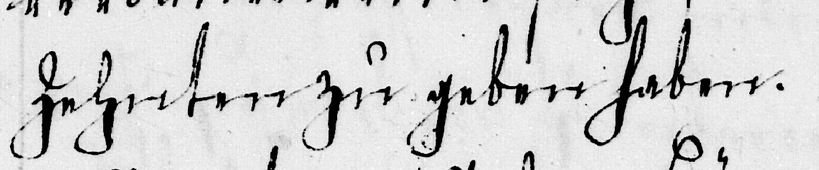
Zehnten zu geben haben.
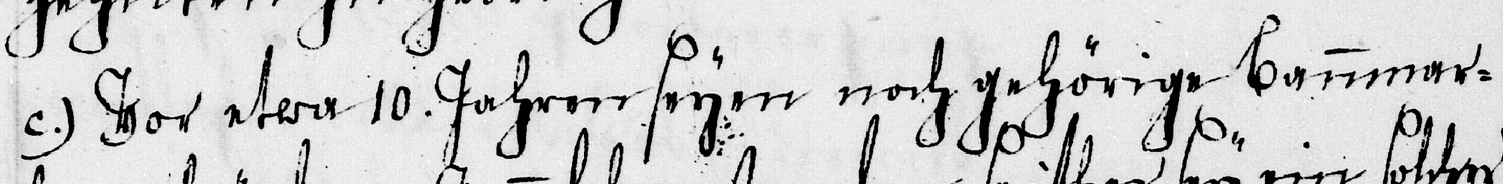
c.) Vor etwa 10. Jahren seyen noch gehörige Bannmar¬
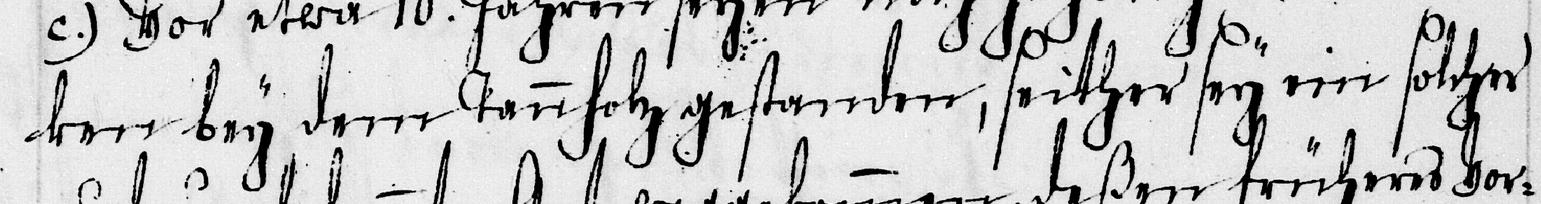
ken bey dem Tannholz gestanden, seither sey ein solches
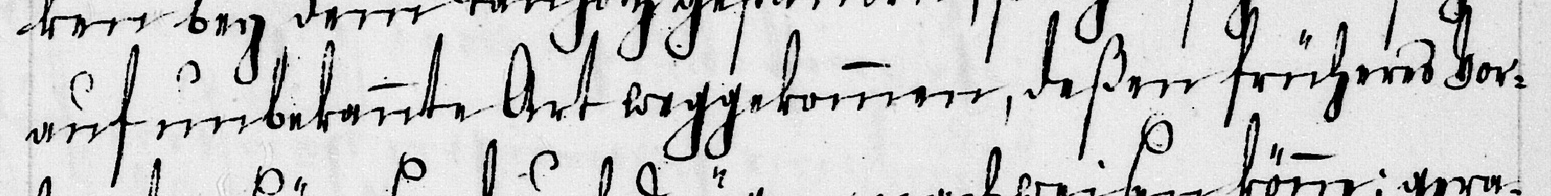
auf unbekannte Art weggekommen, deßen früheres Vor¬
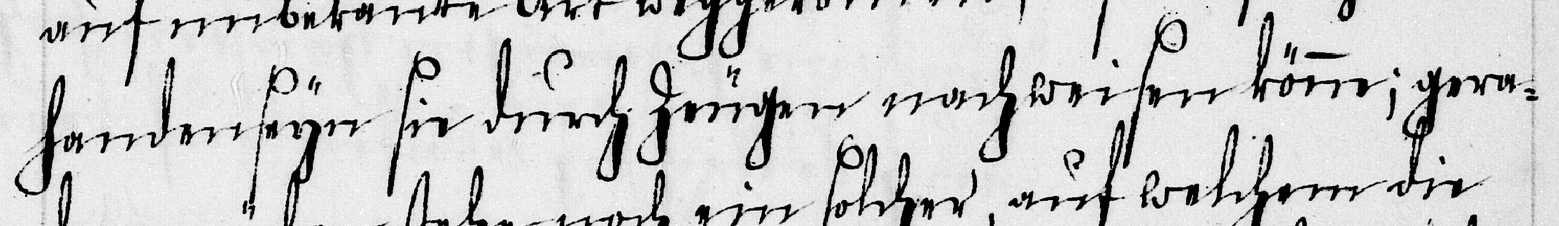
handenseyn sie durch Zeugen nachweisen könne; gera¬
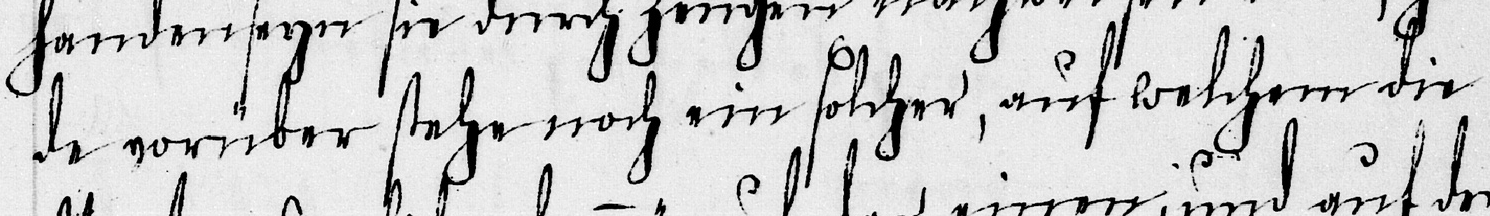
de vorüber stehe noch ein solcher, auf welchem die
